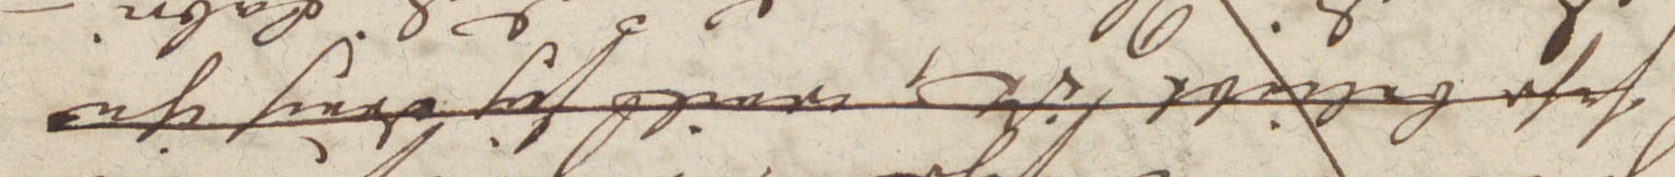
sehr beliebt ist, weil sich durch ihn
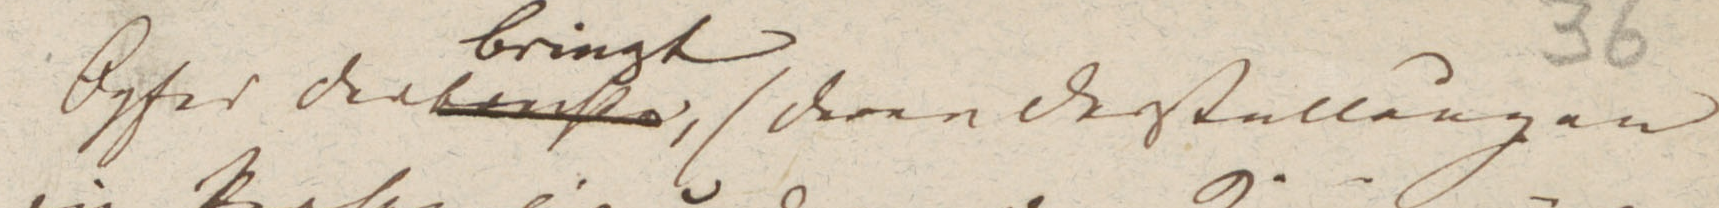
Opfer darbrachtebringt, (deren Darstellungen
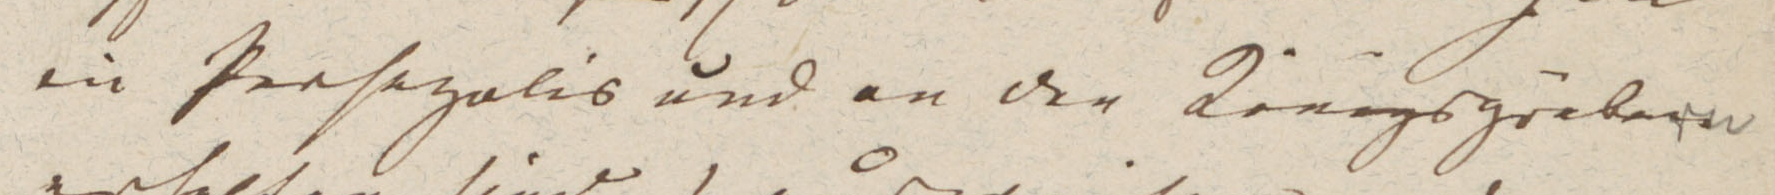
in Persepolis und an den Königsgräbernrn
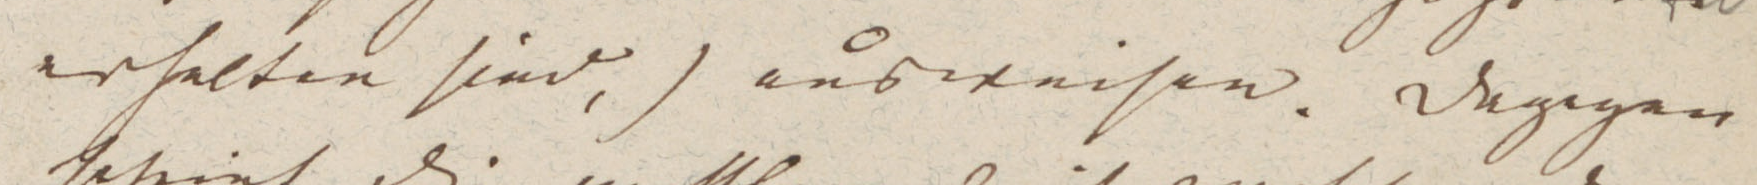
erhalten sind,) ausweisen. Dagegen
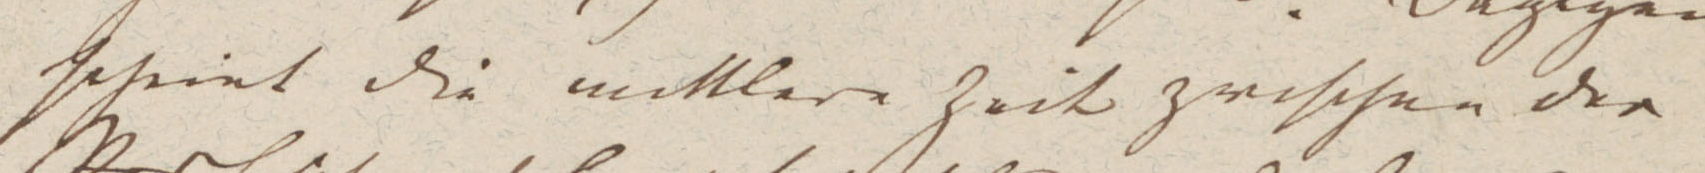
scheint die mittlere Zeit zwischen der
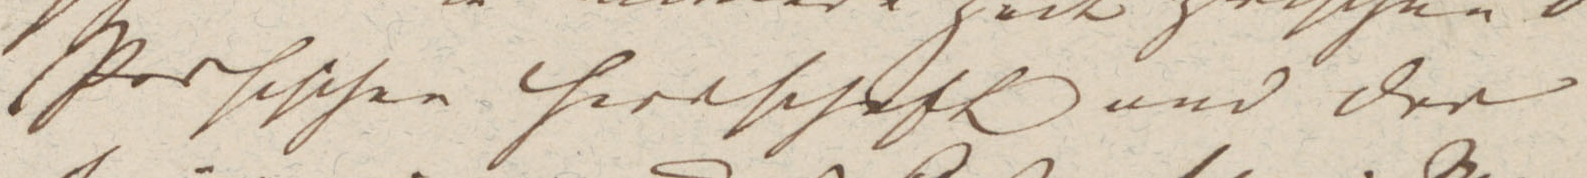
Persischen Herrschaft und der
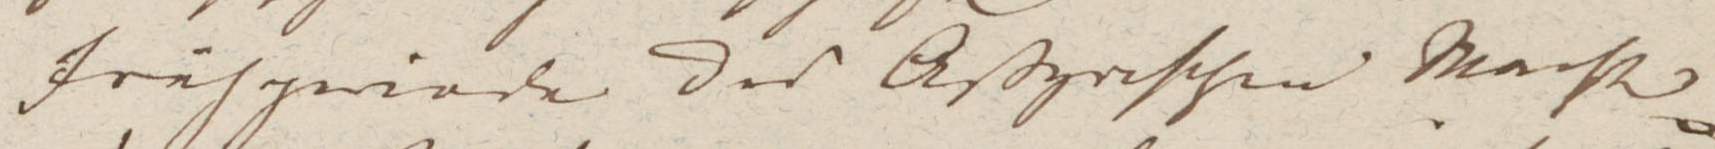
Frühperiode der Assyrischen Macht
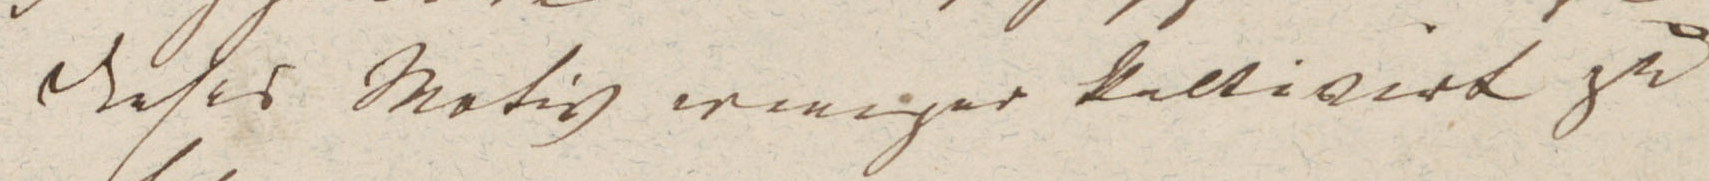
dieses Motiv weniger kultivirt zu
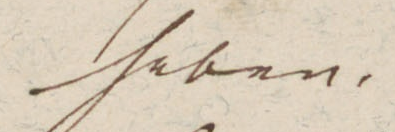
haben.
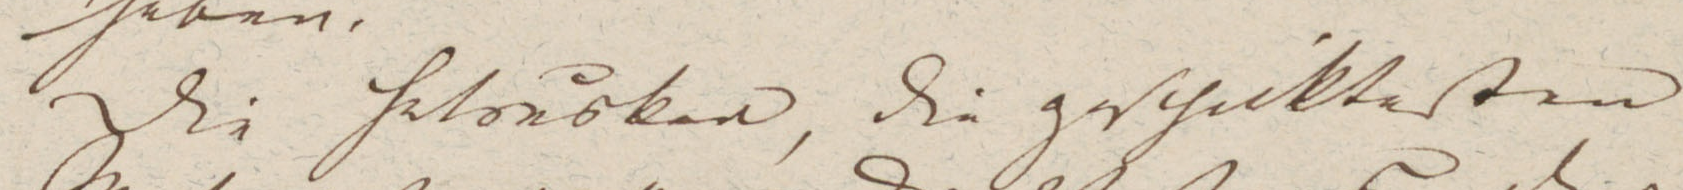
Die Hetrusker, die geschicktesten
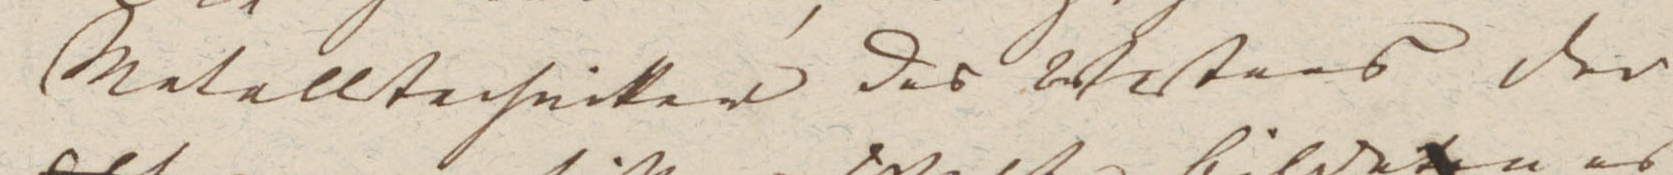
Metalltechniker des Westens der
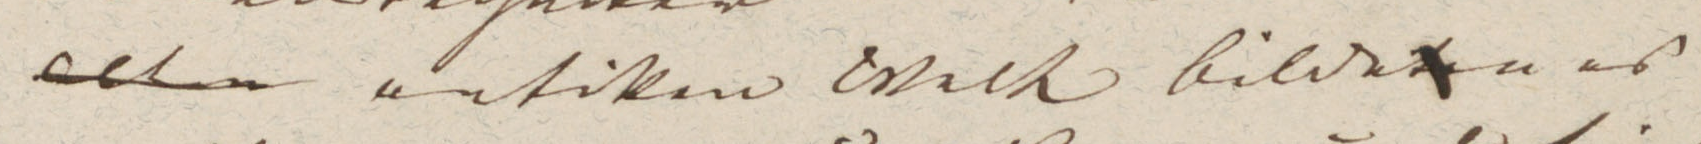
alten antiken Welt bildeten es
